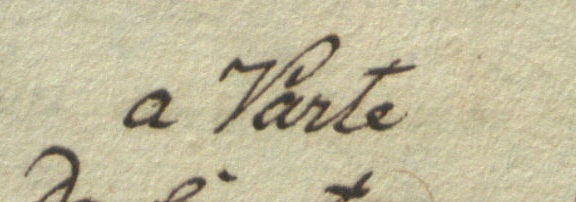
a Parte
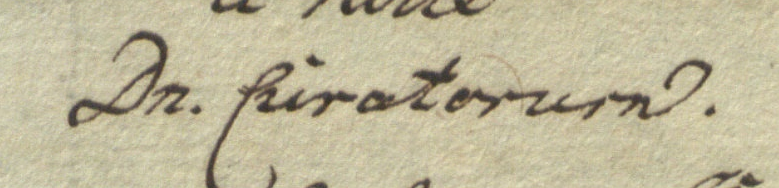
Dn. Curatorum.
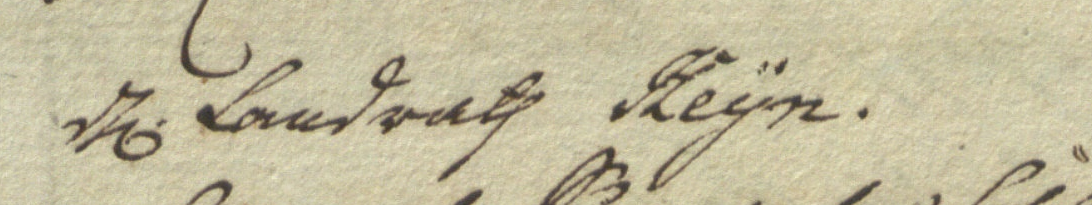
dh. Landrath Heyn.
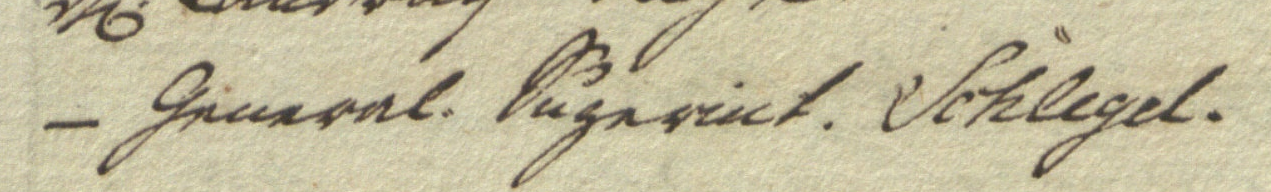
- General Superint. Schlegel.
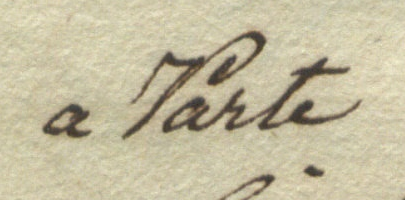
a Parte
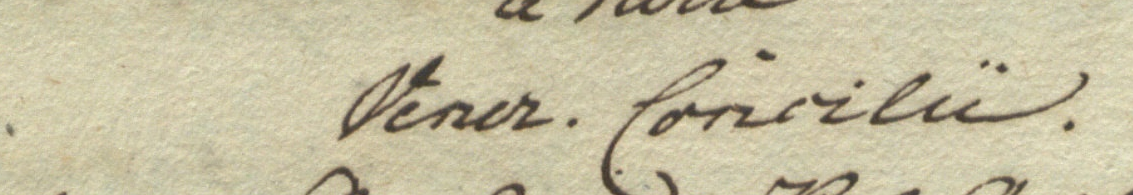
Vener. Concilii.
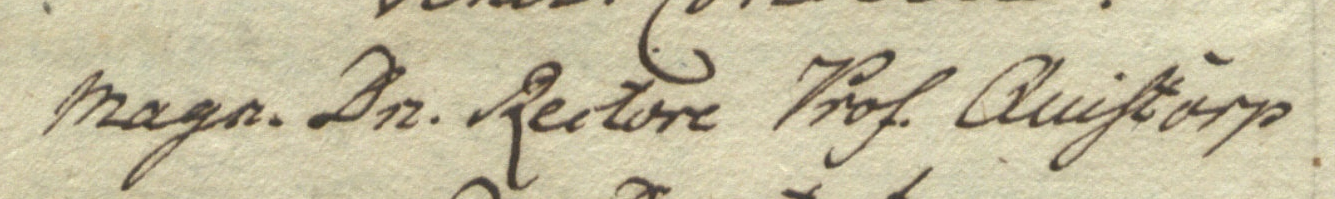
Magn. Dn. Rectore Prof. Quistorp
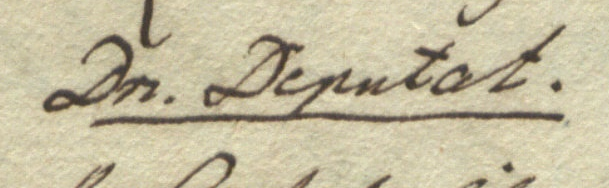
Dn. Deputat.
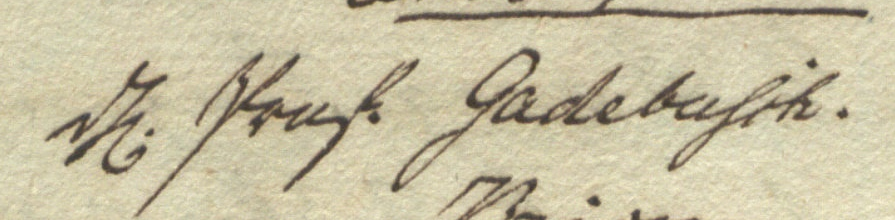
dh. Prof. Gadebusch.
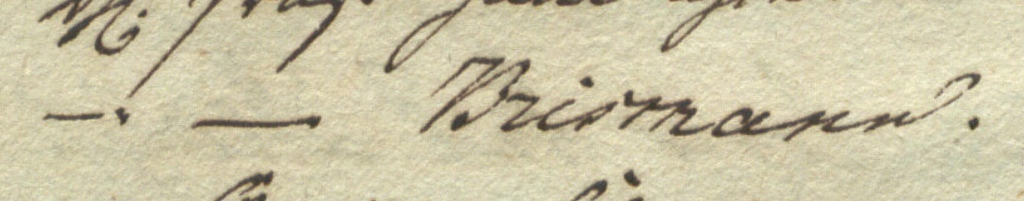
- " - Brismann.
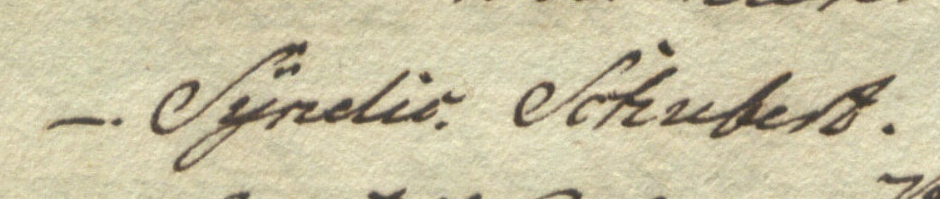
- Syndic. Schubert.
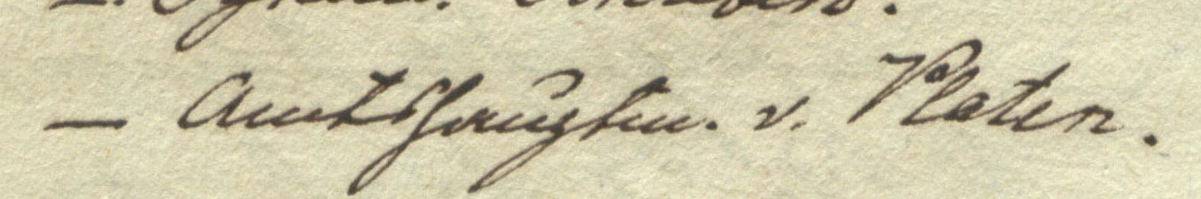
- Amtshauptm. v. Platen
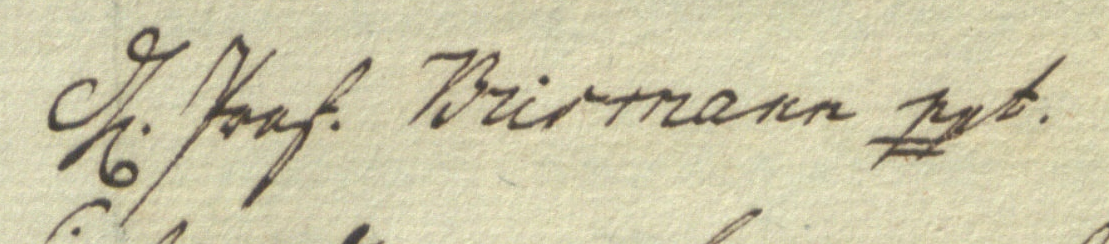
dh. Prof. Brismann ppt.
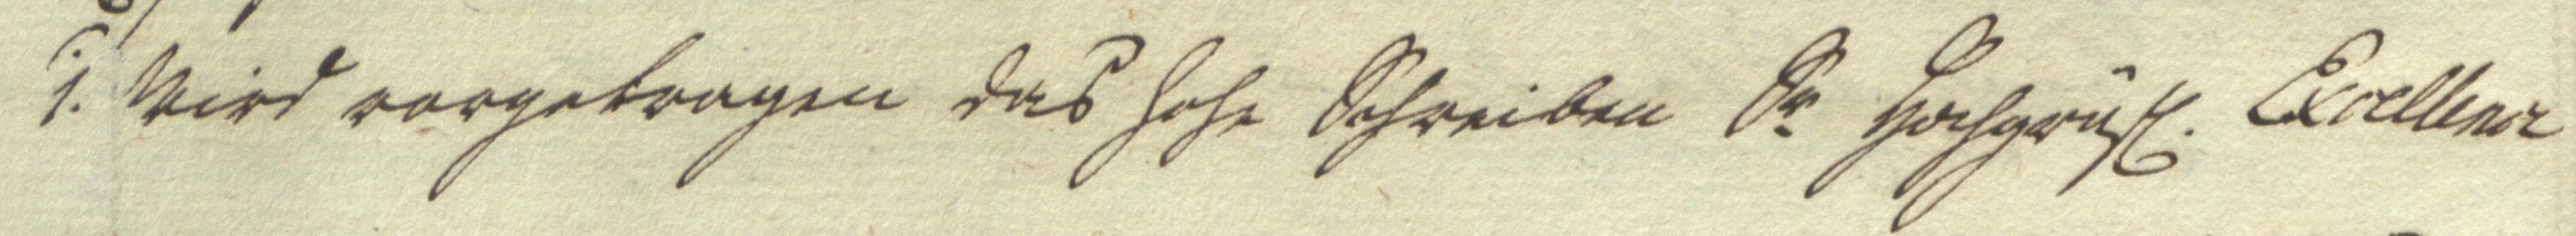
1. Wird vorgetragen das hohe Schreiben Sr. hochgräfl. Excellence
